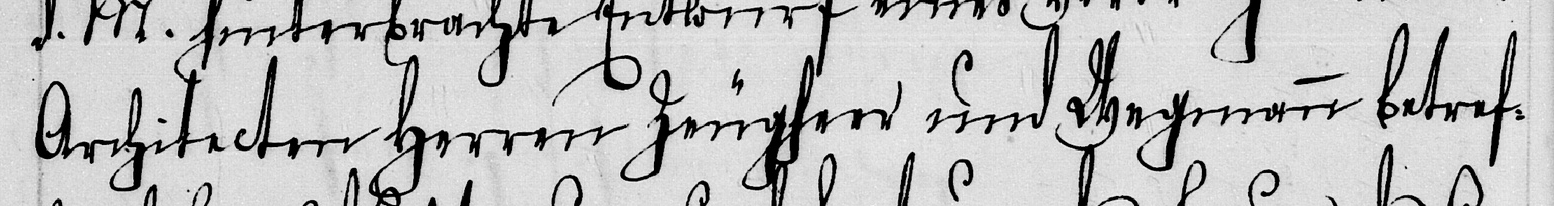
Architecten Herren Zeugheer und Wegmann betref¬
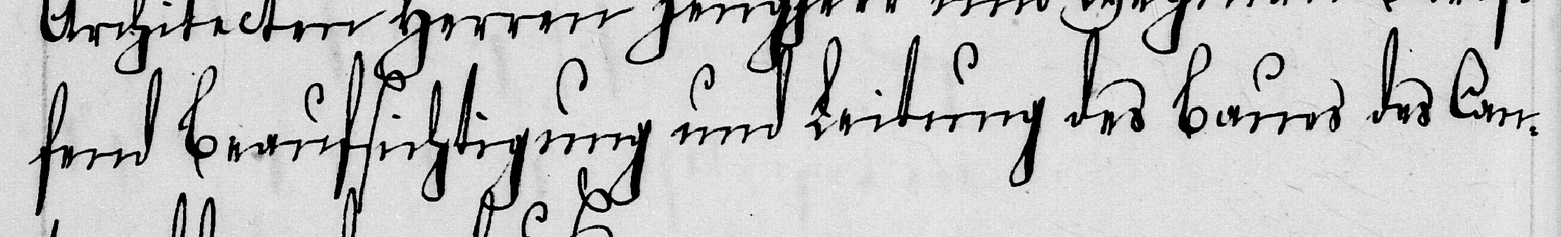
fend Beaufsichtigung und Leitung des Baus des Can¬
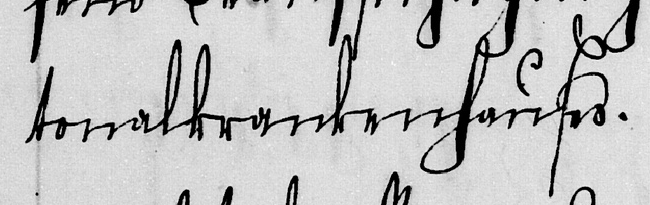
tonalkrankenhauses.
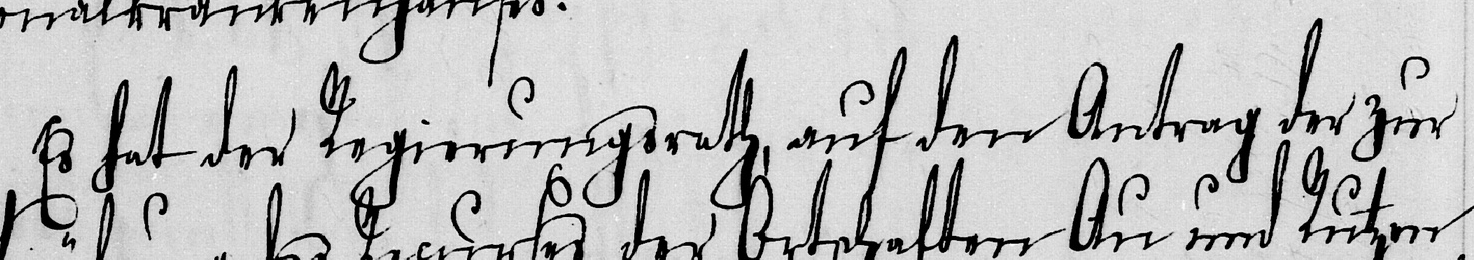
Es hat der Regierungsrath, auf den Antrag der zur
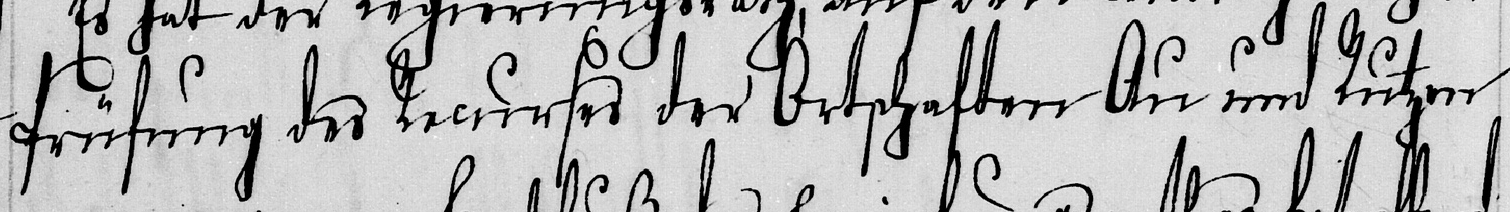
Prüfung des Recurses der Ortschaften Au und Rutzen
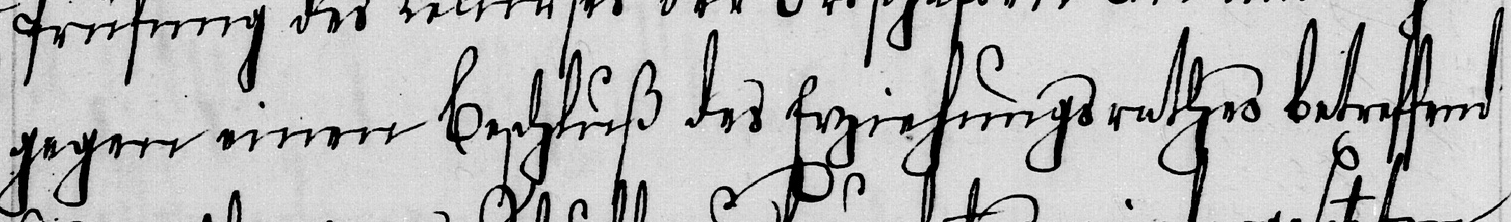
gegen einen Beschluß des Erziehungsrathes betreffe¬
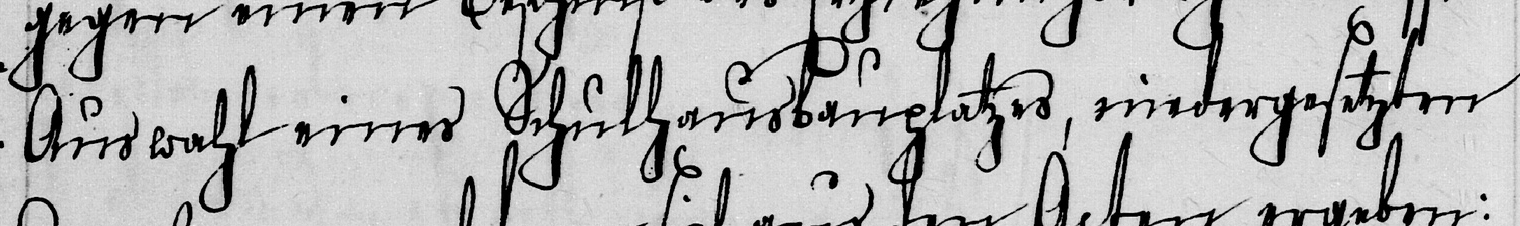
Auswahl eines Schulhausbauplatzes, niedergesetzten
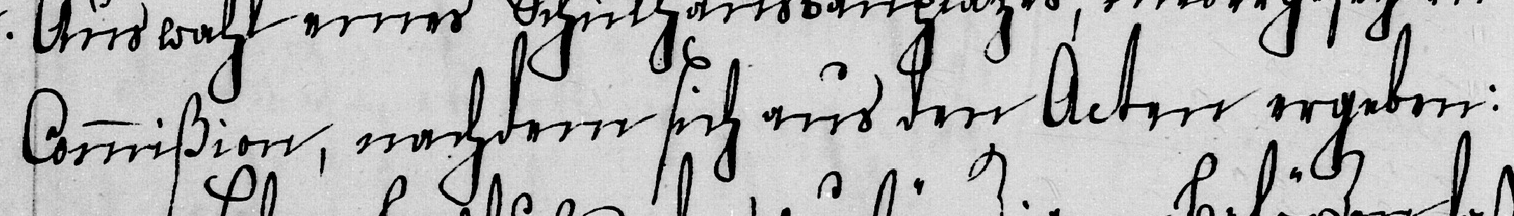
Commißion, nachdem sich aus den Acten ergeben:
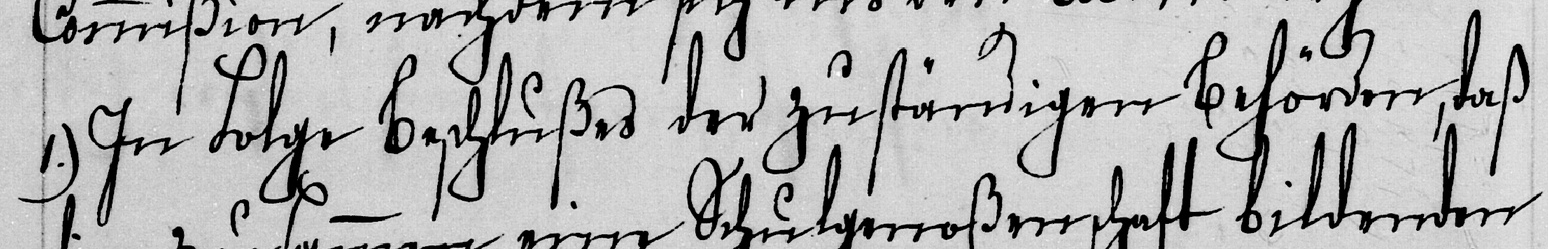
1.) In Folge Beschlußes der zuständigen Behörde, daß
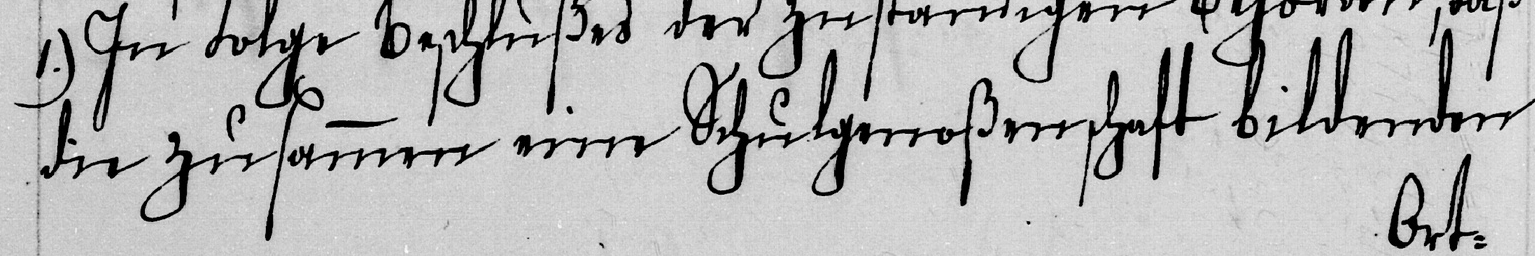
die zusammen eine Schulgenoßenschaft bildenden
